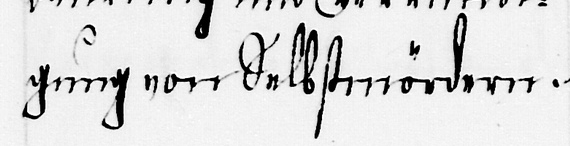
gung von Selbstmördern.
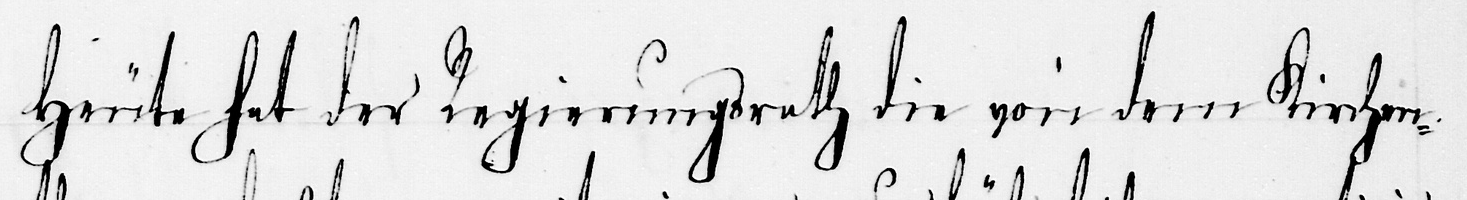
Heute hat der Regierungsrath die von dem Kirchen¬
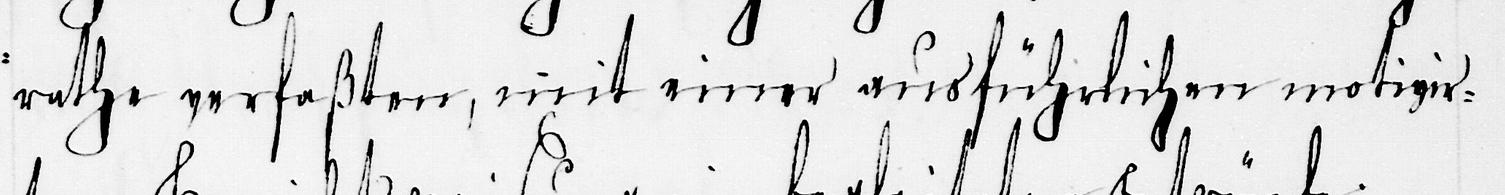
rathe verfaßten, mit einer ausführlichen motivir¬
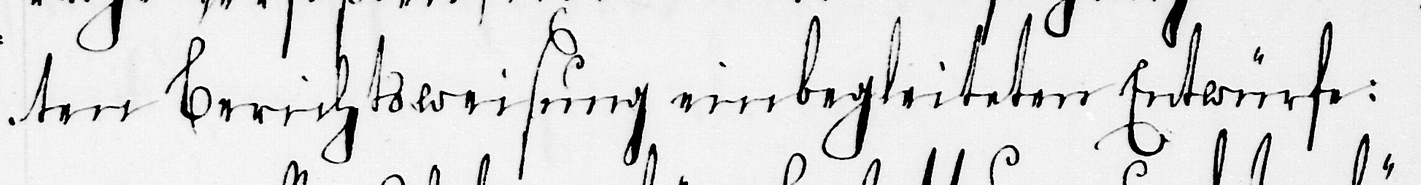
ten Berichtsweisung einbegleiteten Entwürfe:
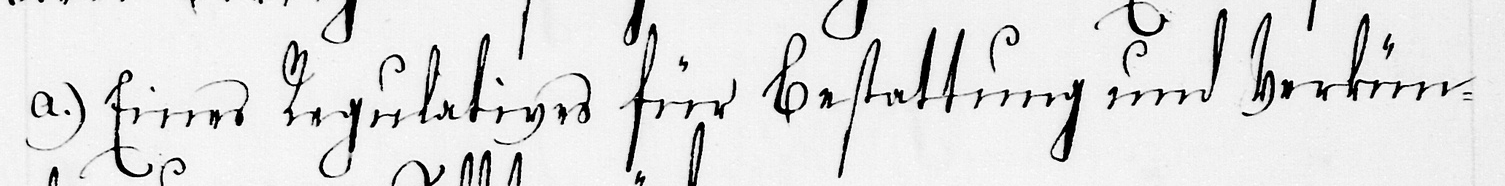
a.) Eines Regulatives für Bestattung und Verkün¬
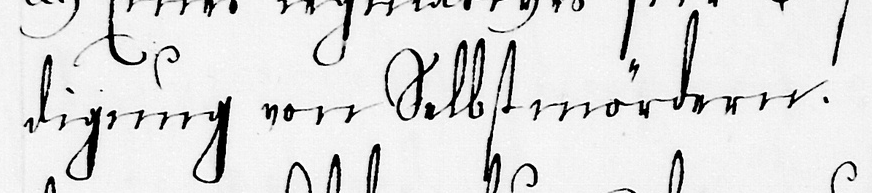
digung von Selbstmördern.
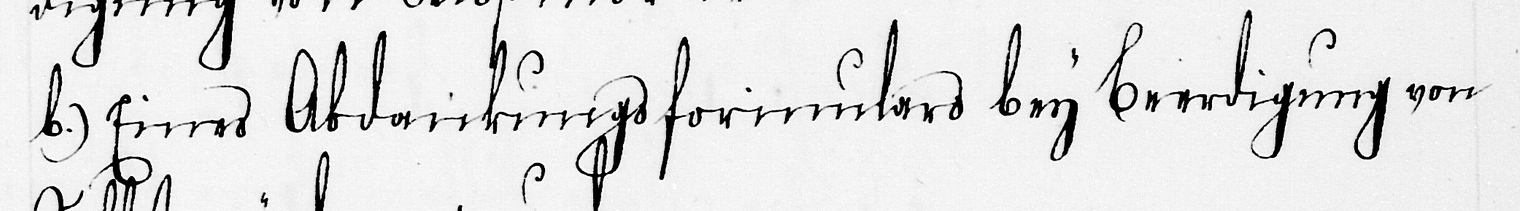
b.) Eines Abdankungsformulars bey Beerdigung von
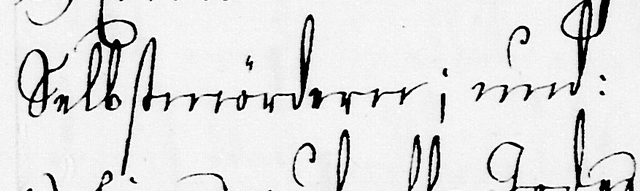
Selbstmördern; und:
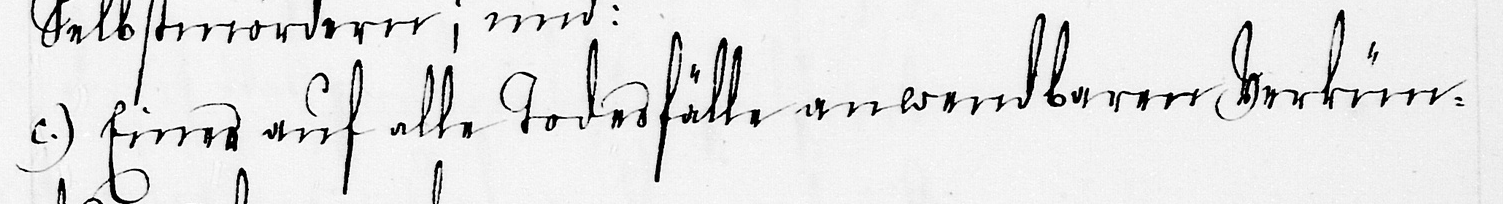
c.) Einer auf alle Todesfälle anwendbaren Verkünd¬
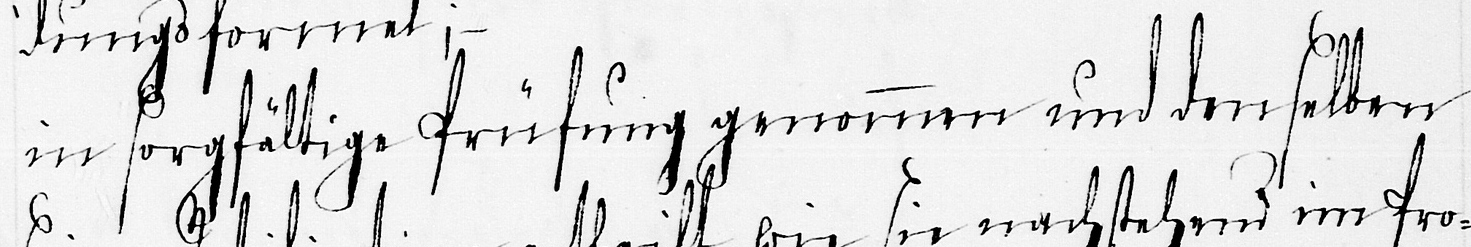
in sorgfältige Prüfung genommen und denselben
